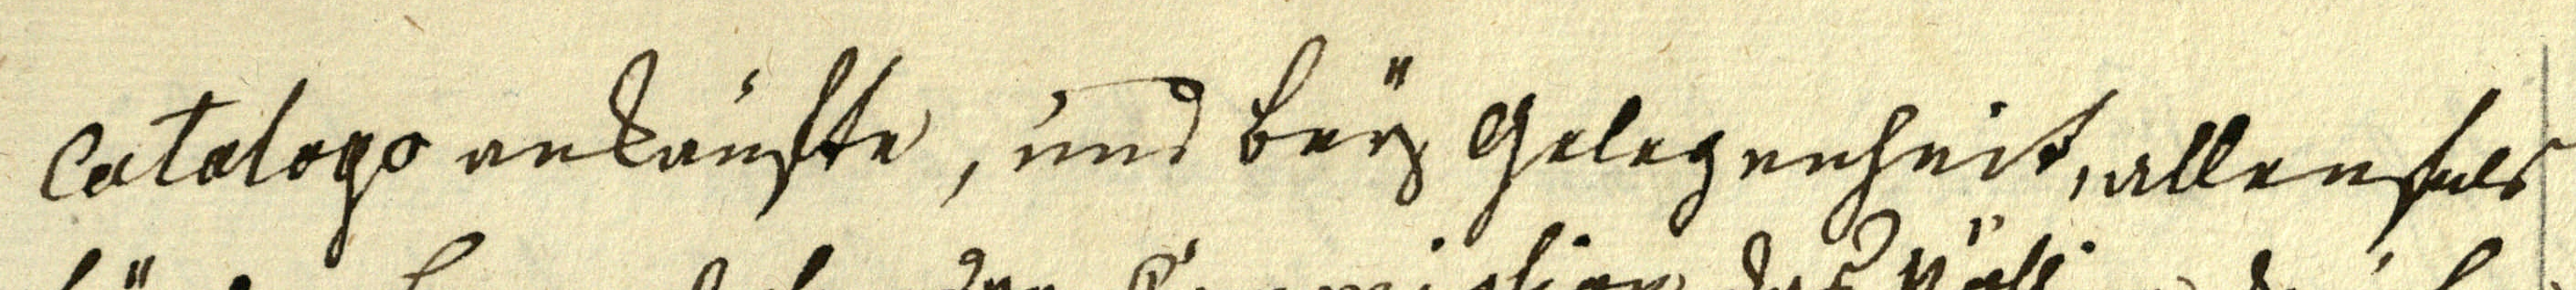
Catalogo ankaufte, und beÿ Gelegenheit, allenfals
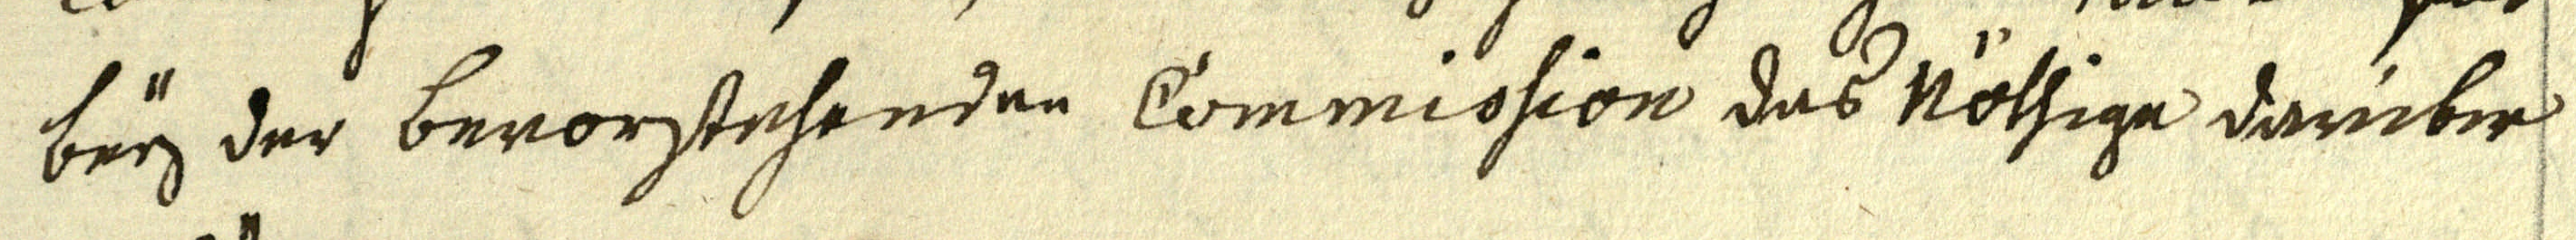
beÿ der bevorstehenden Commission das Nöthige darüber
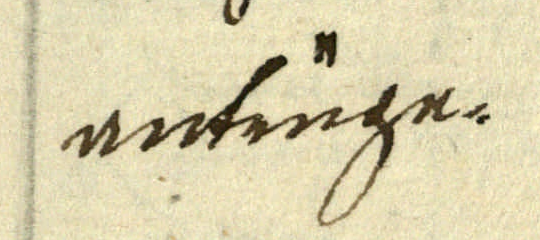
antrüge.
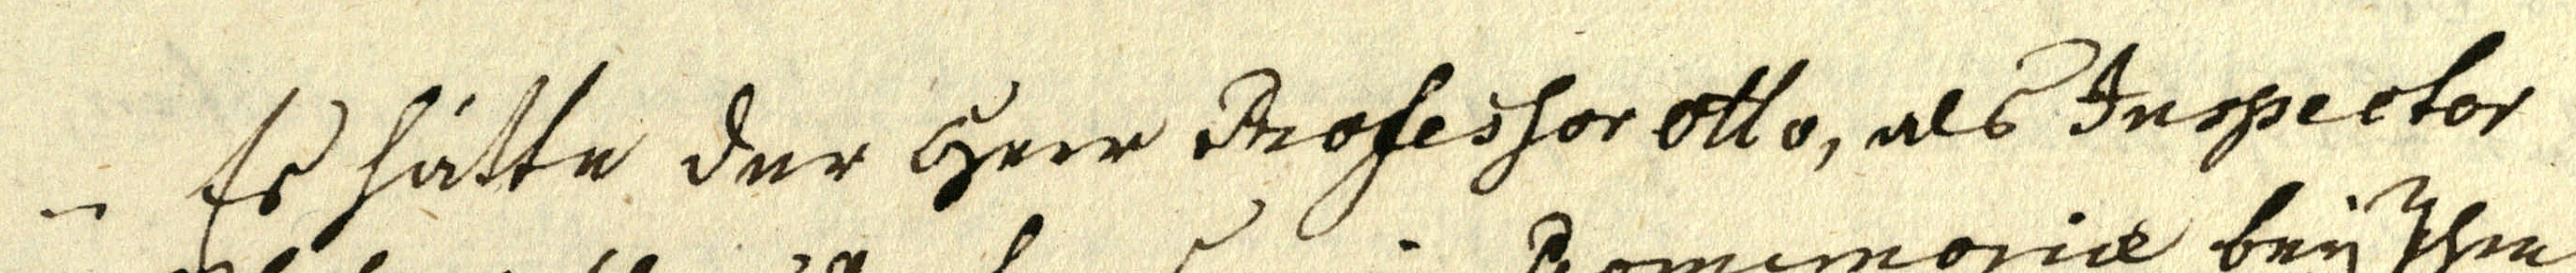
Es hätte der Herr Professor Otto, als Inspector
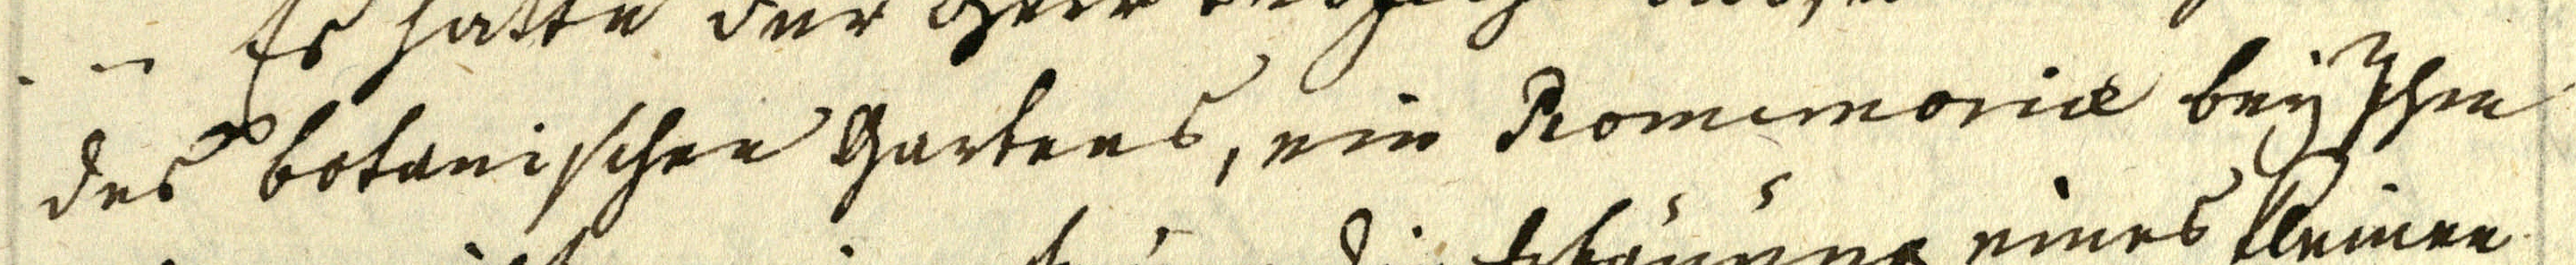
des botanischen Gartens, ein Promemoria beÿ Ihm
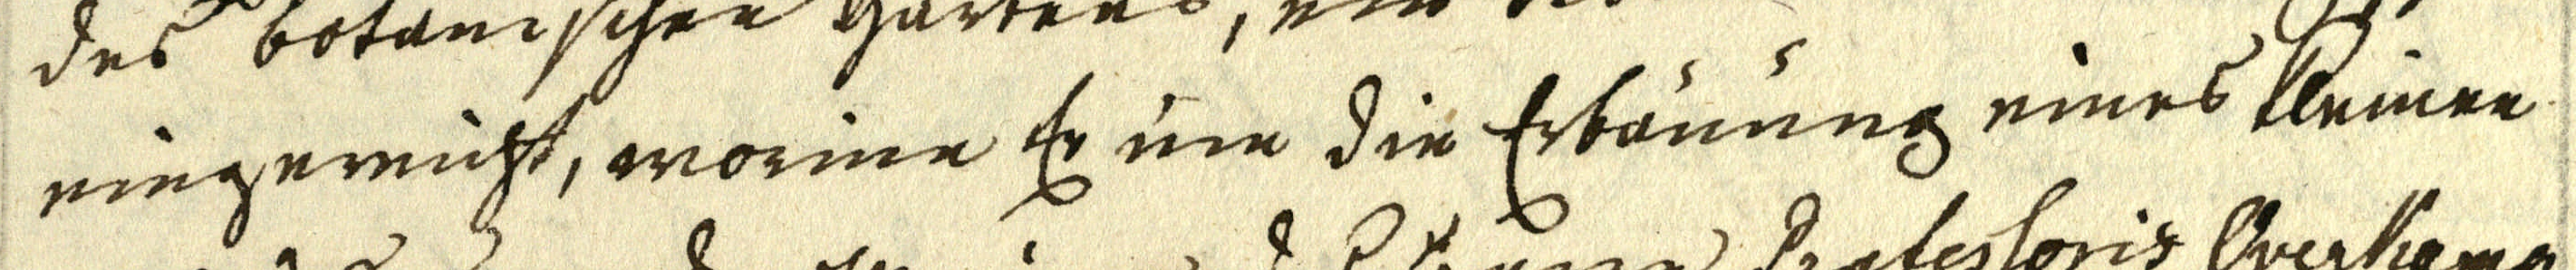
eingereicht, worin Er um die Erbauung eines kleinen
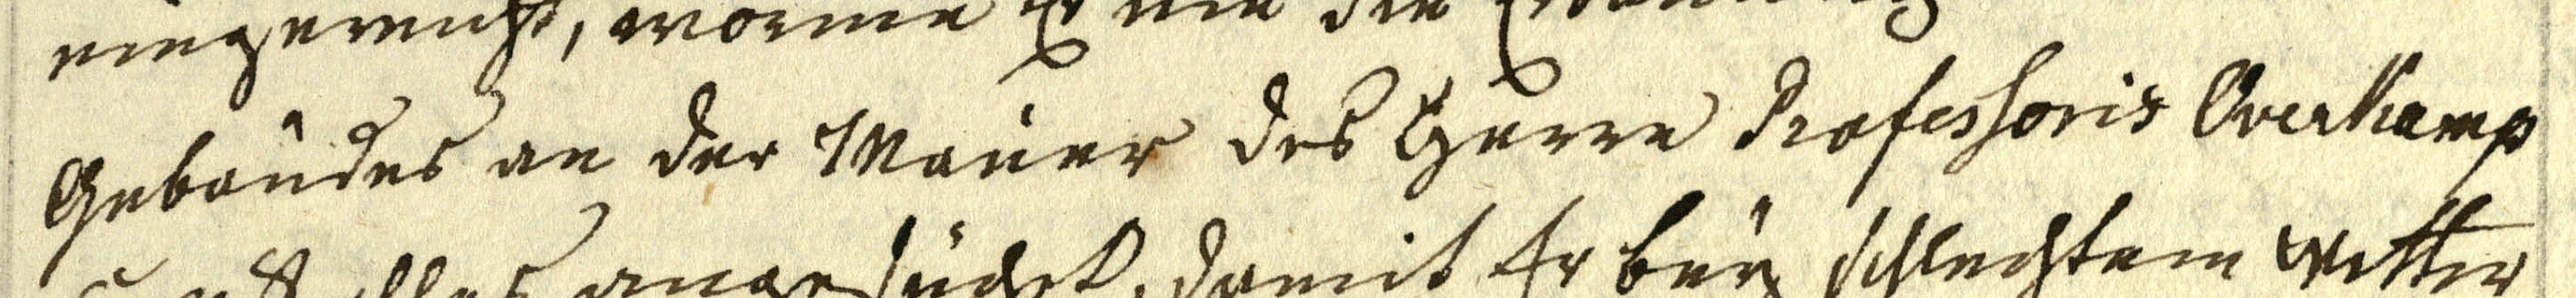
Gebäudes an der Mauer des Herrn Professoris Overkamp
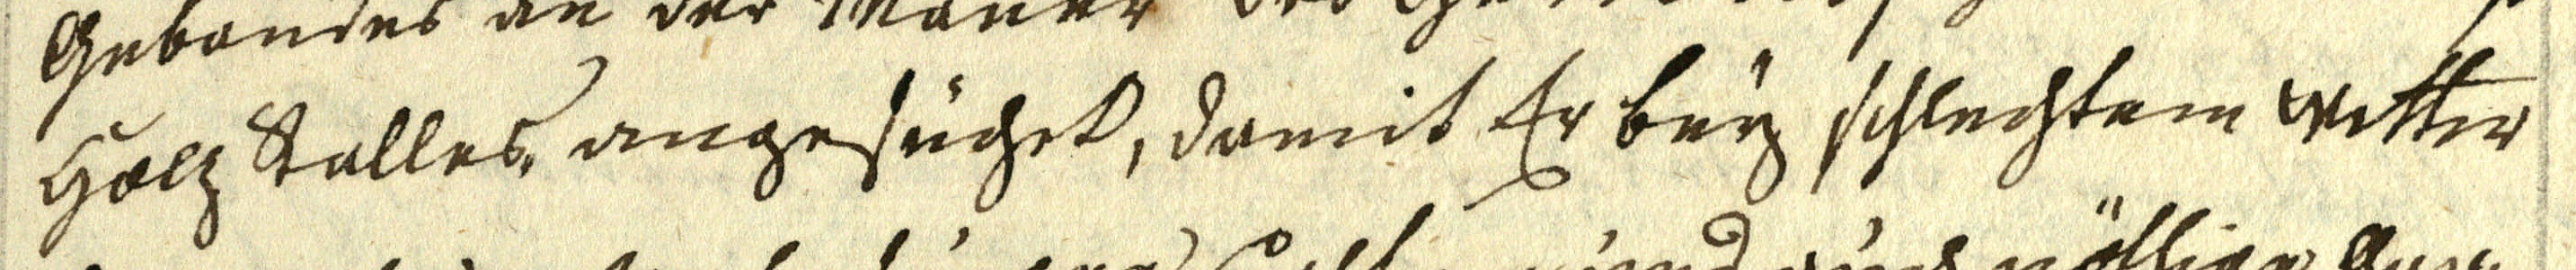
Holz Stalles angesuchet, damit Er beÿ schlechtem Wetter
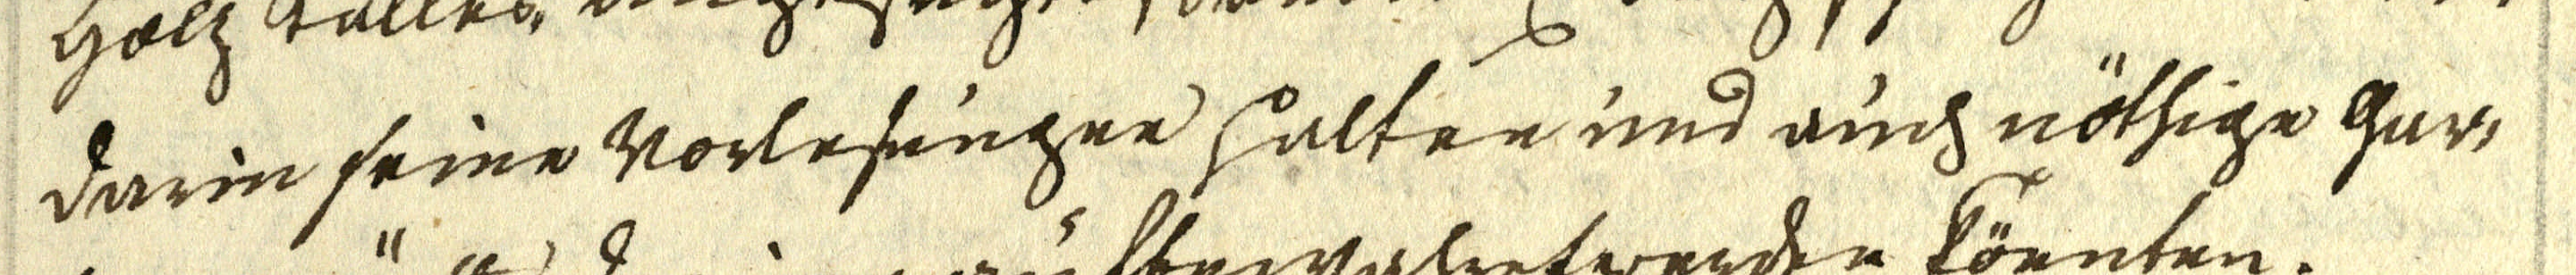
darin seine Vorlesungen halten und auch nöthige Gar¬
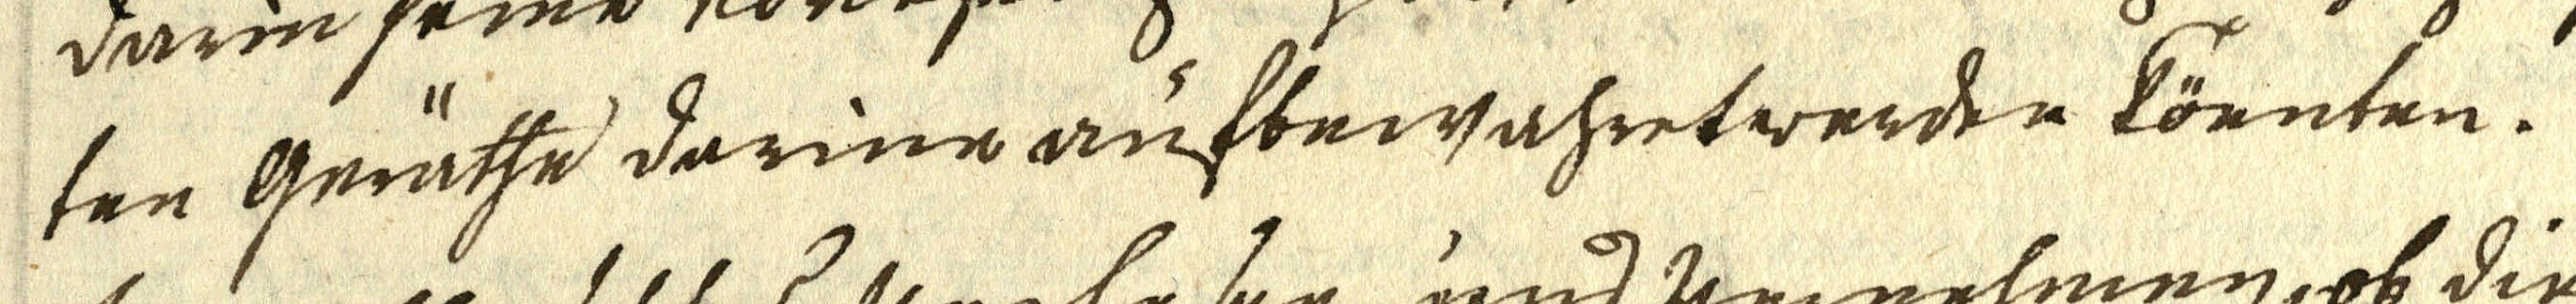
ten Geräthe darinn aufbewahret werden könnten.
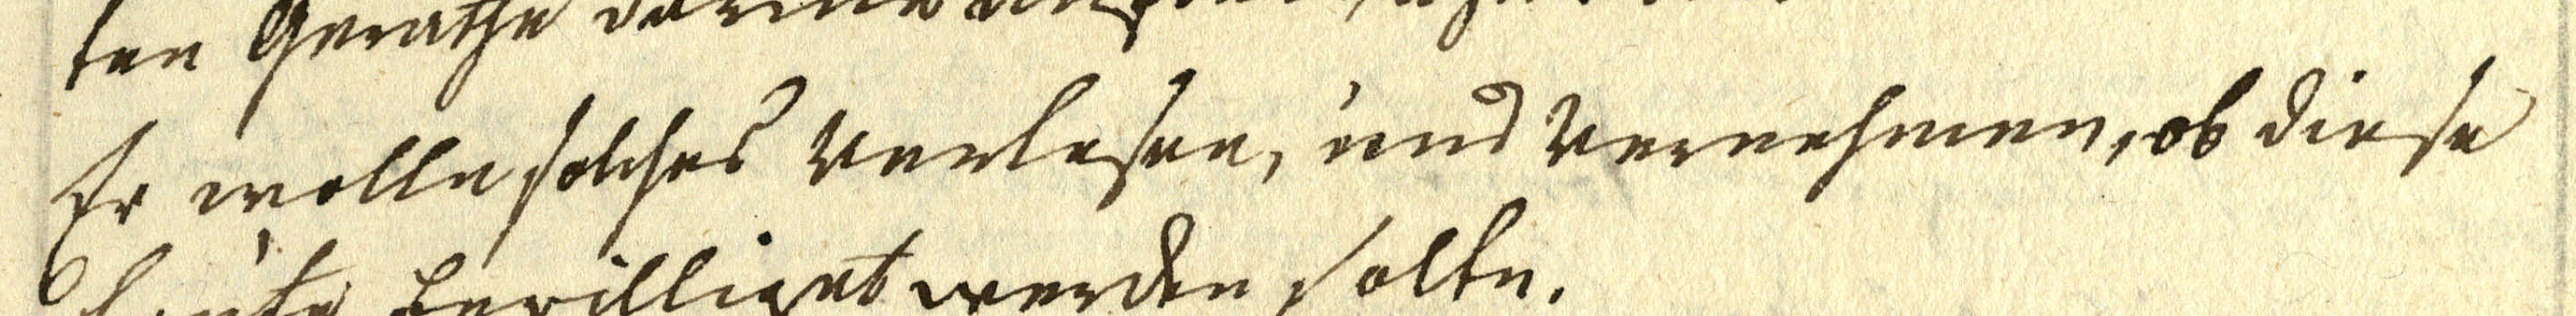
Er wolle solches verlesen, und vernehmen, ob diese
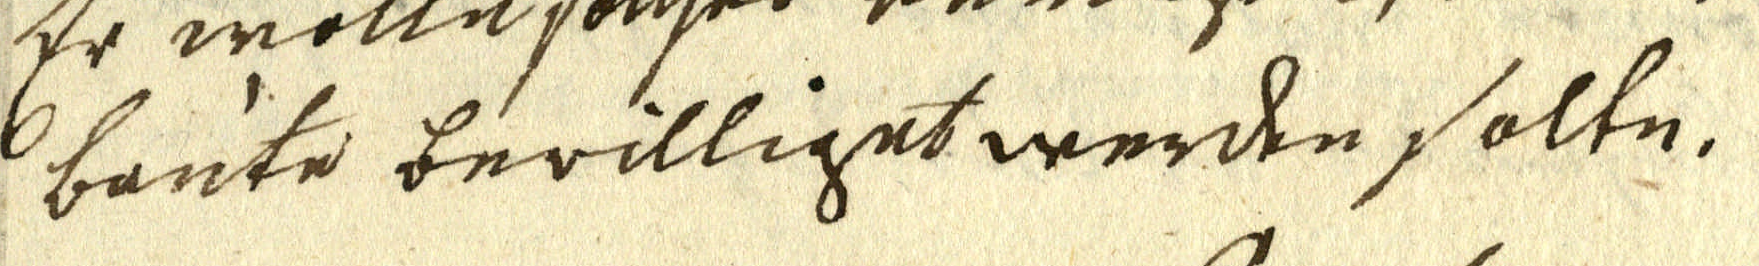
Baute bewilliget werden solte.
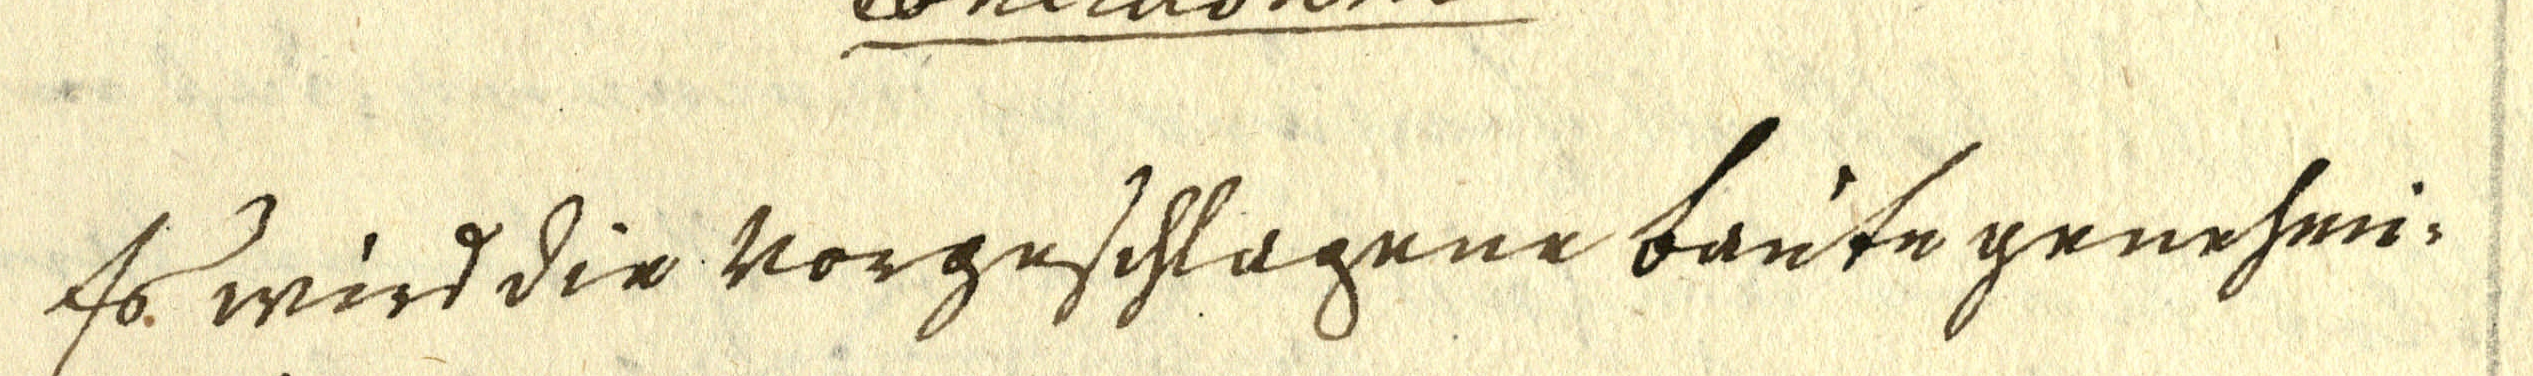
Er wird die vorgeschlagene Baute genehmi¬
